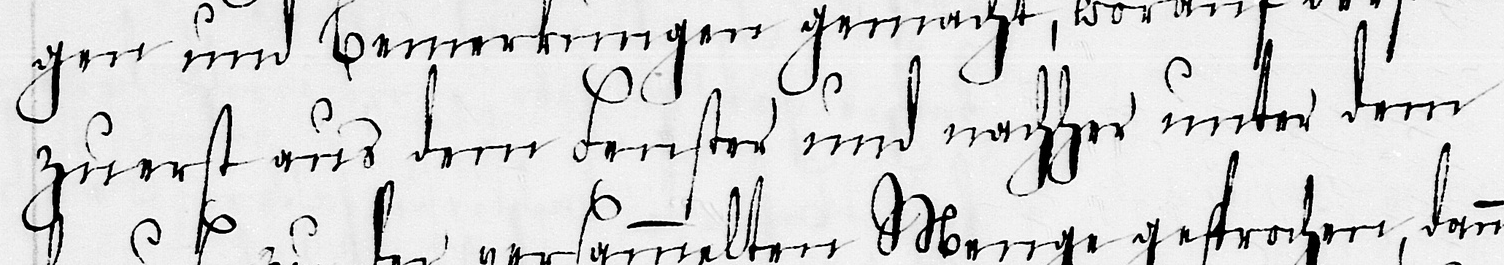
zuerst aus dem Fenster und nachher unter dem
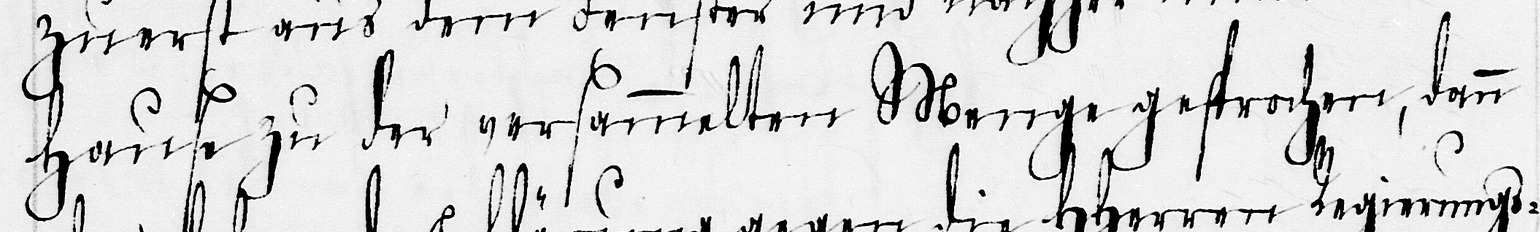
Hause zu der versammelten Menge gesprochen, dann
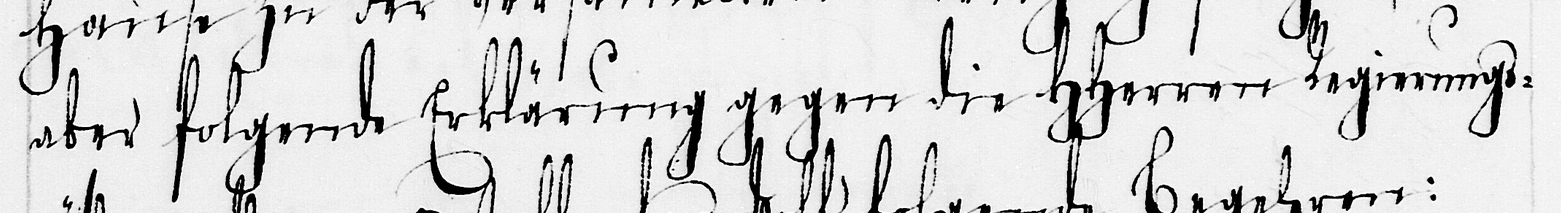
aber folgende Erklärung gegen die HHerren Regierungs¬
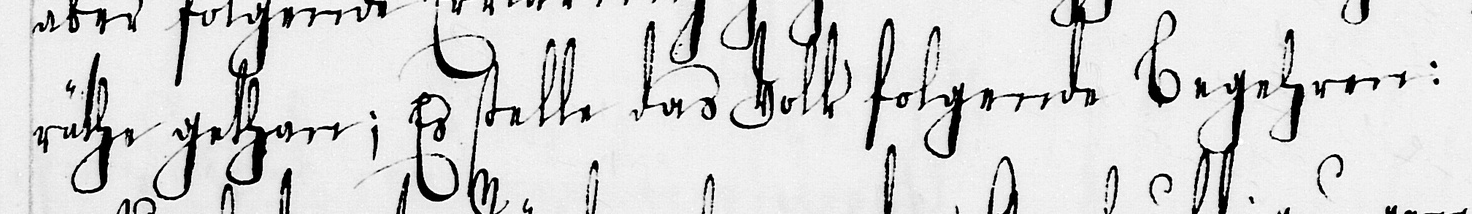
räthe gethan; Es stelle das Volk folgende Begehren:
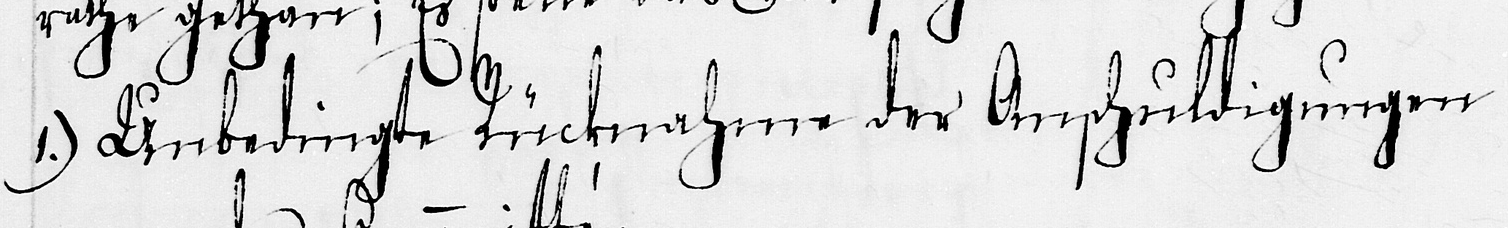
1.) Unbedingte Rücknahme der Anschuldigungen
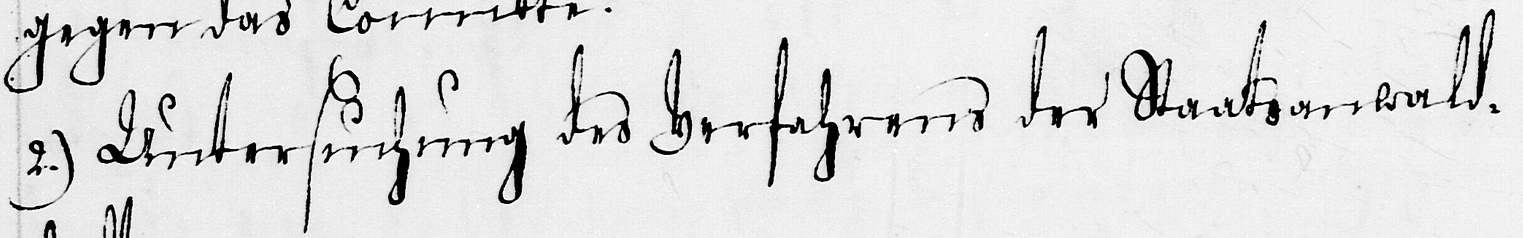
2.) Untersuchung des Verfahrens der Staatsanwald¬
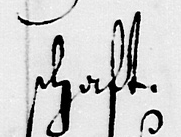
schaft.
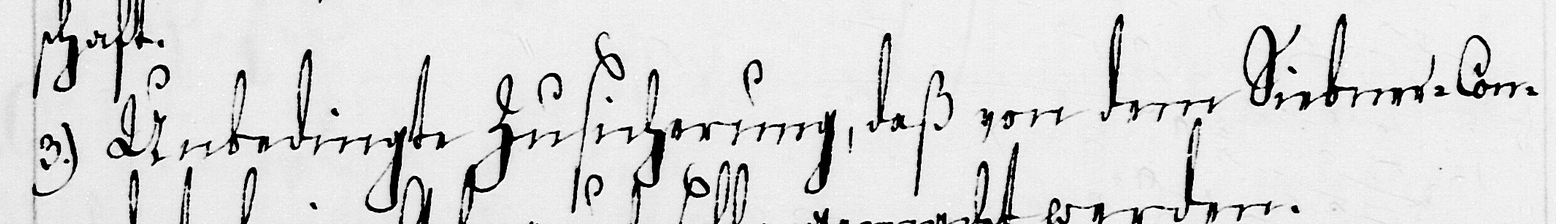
3.) Unbedingte Zusicherung, daß von dem Siebner-Con¬
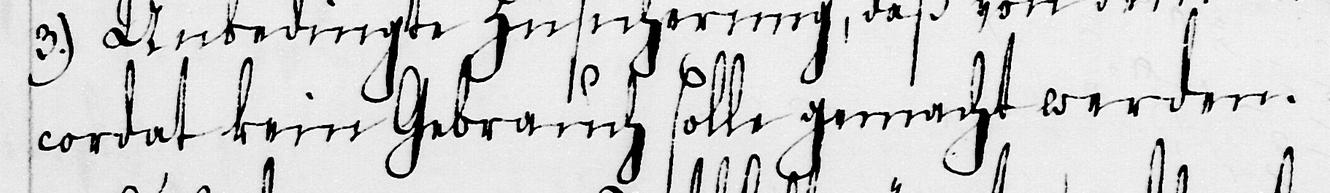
cordat kein Gebrauch solle gemacht werden.
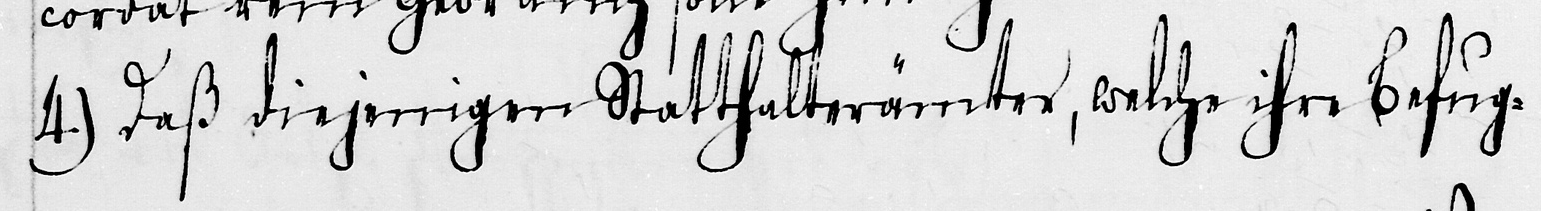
4.) Daß diejenigen Statthalterämter, welche ihre Befug-
